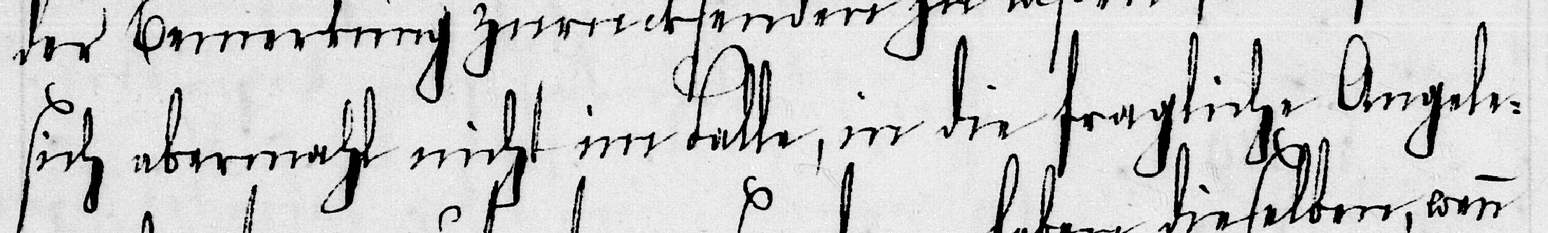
sich abermahl nicht im Falle, in die fragliche Angele¬
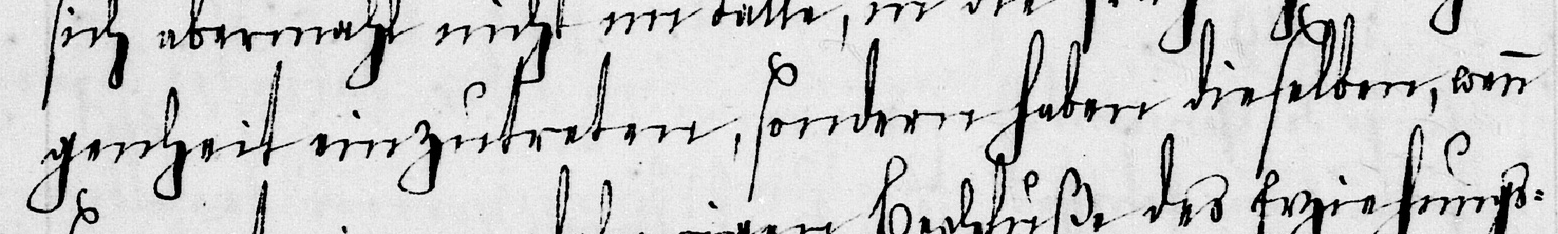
genheit einzutreten, sondern haben dieselben, wenn
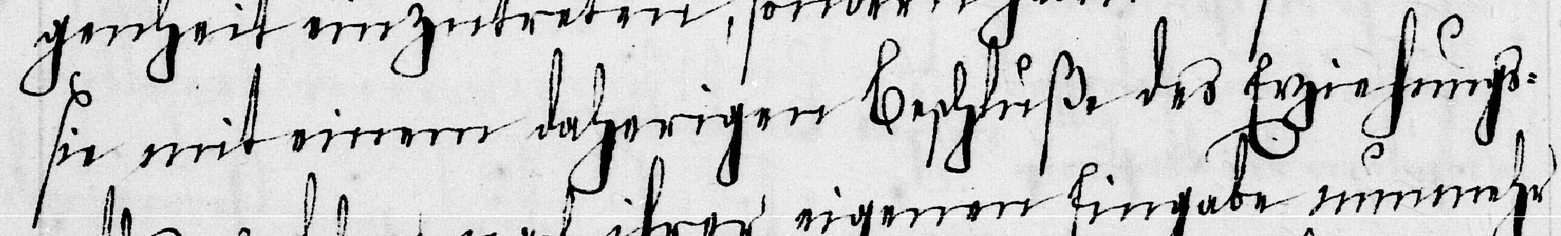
sie mit einem daherigen Beschluße des Erziehungs¬
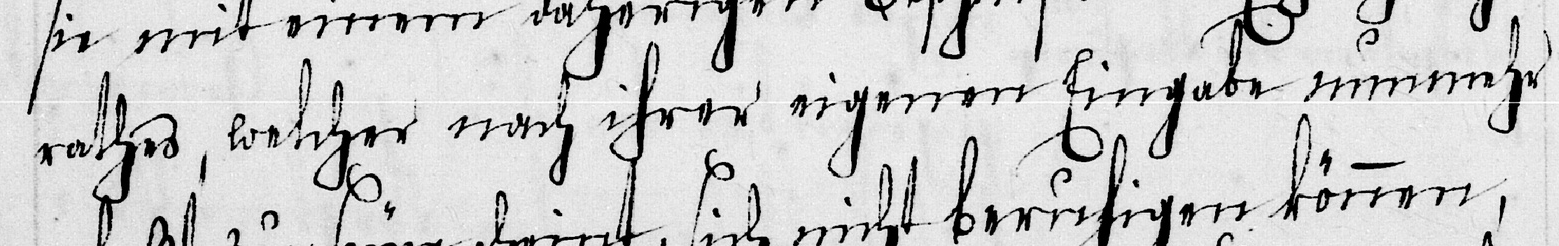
rathes, welcher nach ihrer eigenen Eingabe nunmehr
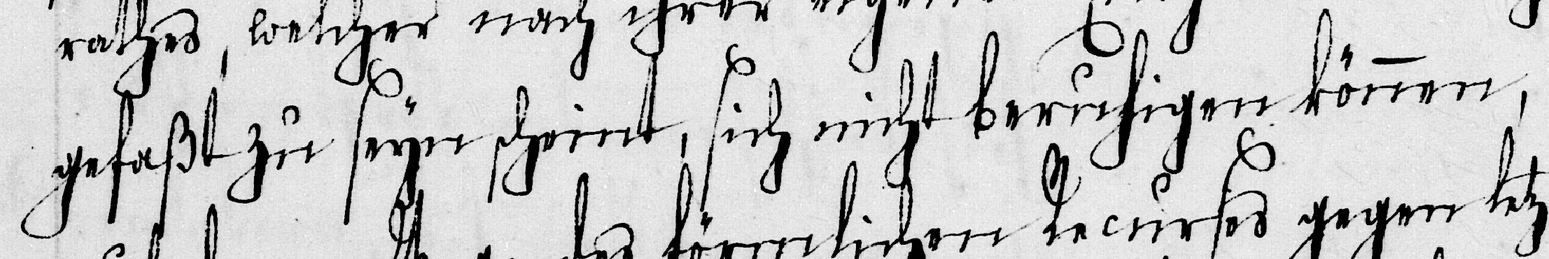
gefaßt zu seyn scheint, sich nicht beruhigen können,
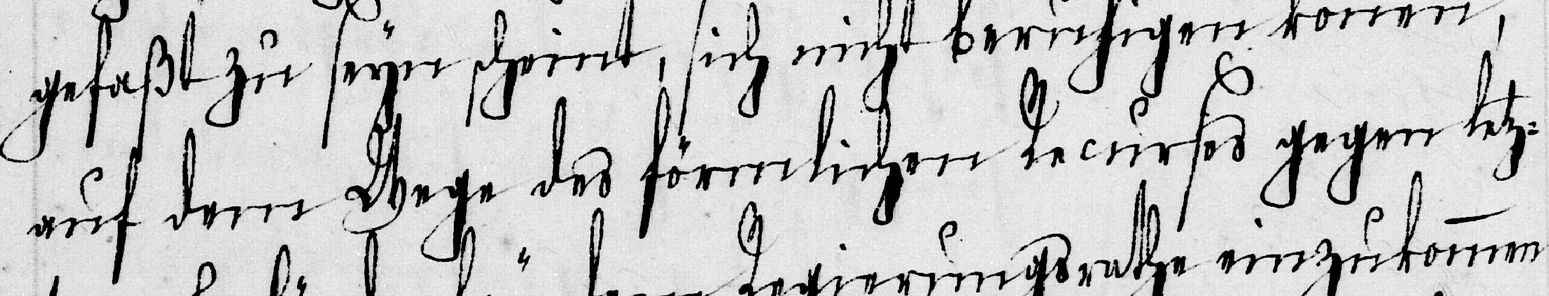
auf dem Wege des förmlichen Recurses gegen let¬
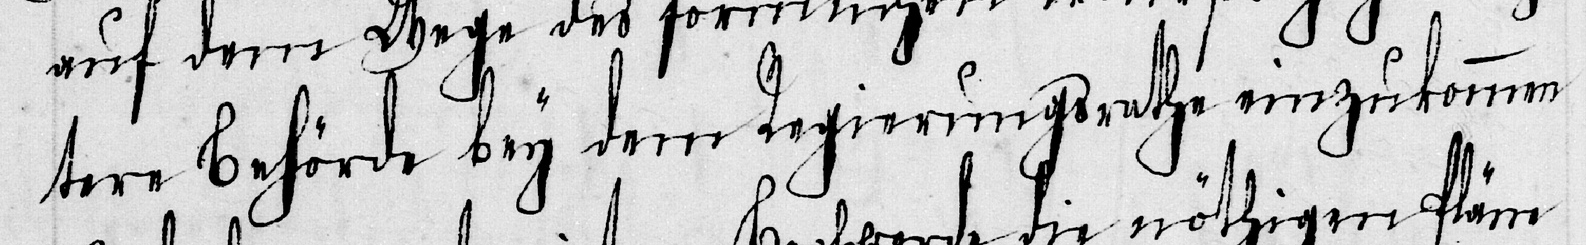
ztere Behörde bey dem Regierungsrathe einzukommen
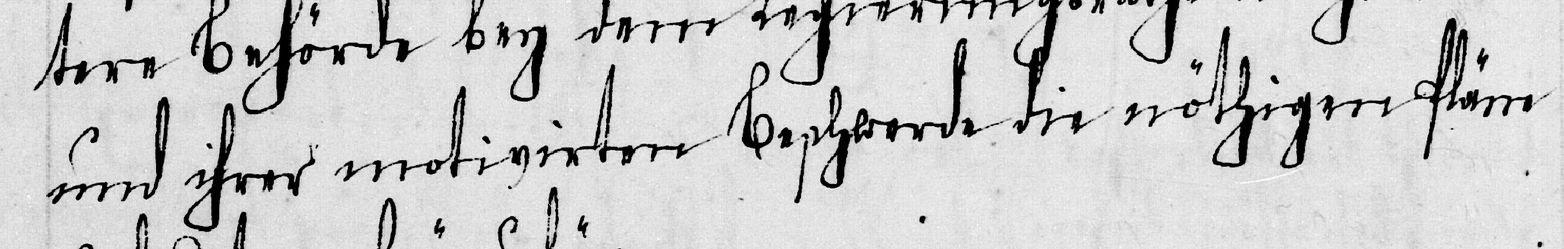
und ihrer motivirten Beschwerde die nöthigen Pläne
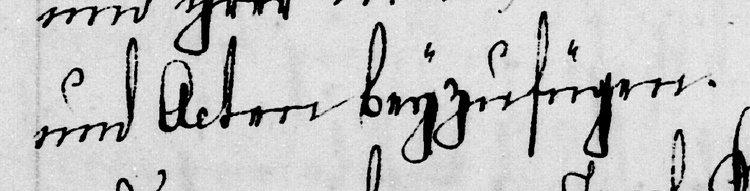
und Acten beyzufügen.
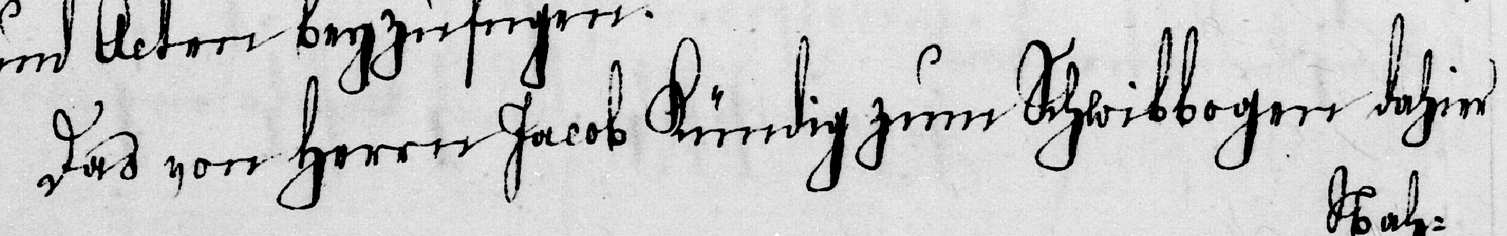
Das von Herrn Jacob Kündig zum Schwibbogen dahier
